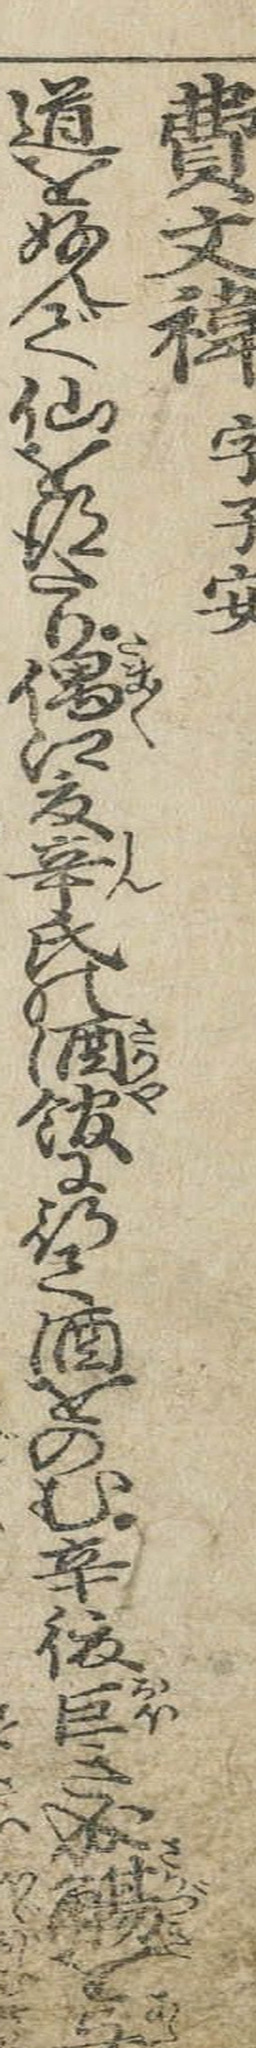道を好んで仙を得たり。偶江夏辛氏の酒館に行て酒をのむ。辛後巨き成觴を与
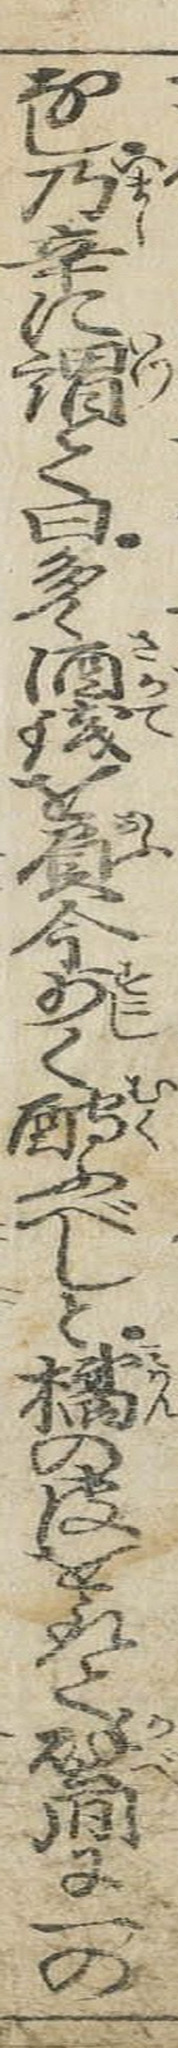なし。乃辛に謂て曰。多く酒銭を負今少く酬ふべしと。橘の皮を取て壁間に一の
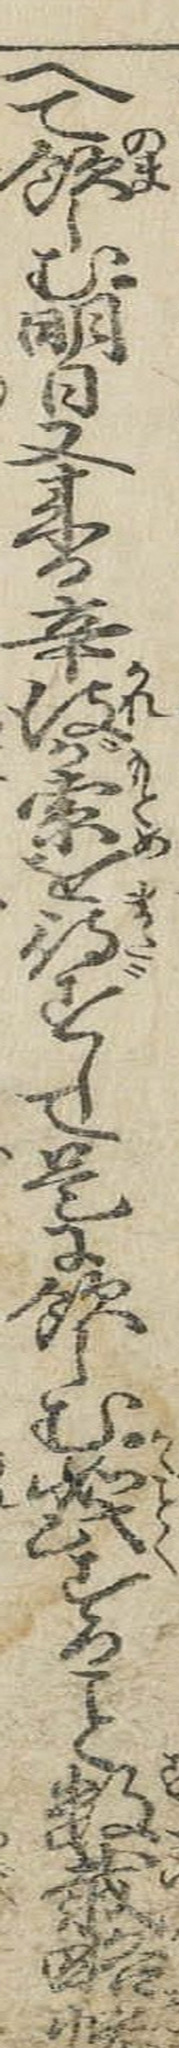へて飲しむ。明日又来る辛彼が索を待ずして是に飲しむ。如此すること数載略惜意
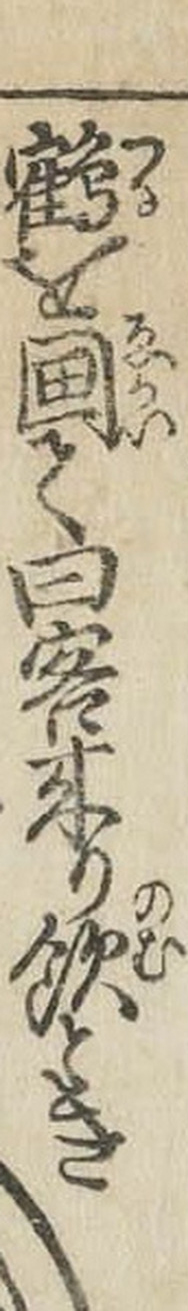鶴を画て曰客来り飲とき
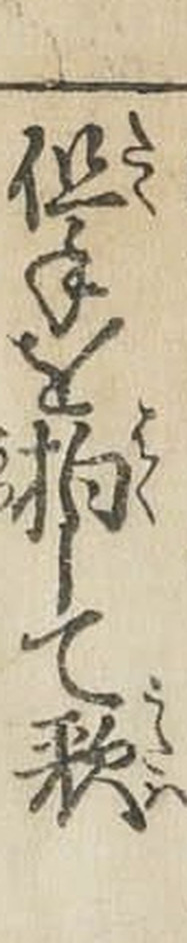但手を拍して歌
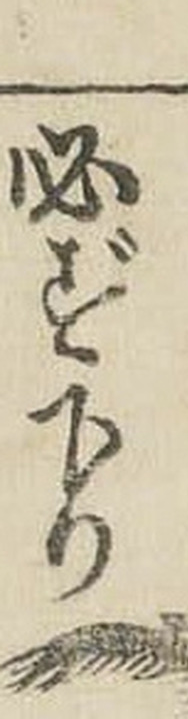必ず下り
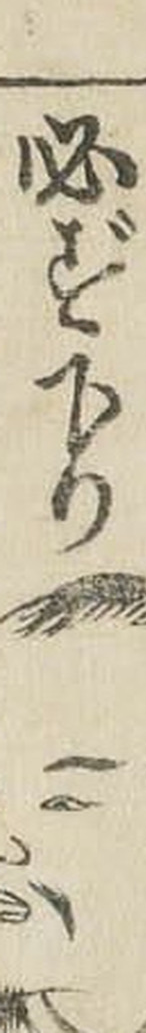必ず下り
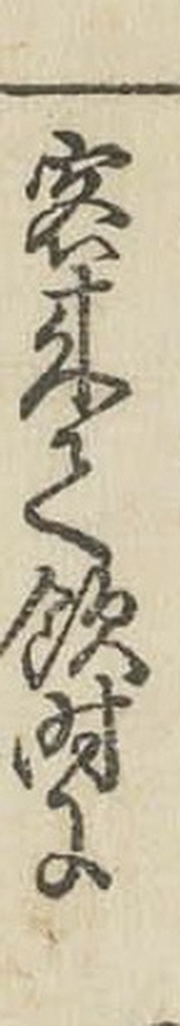客来て飲時に
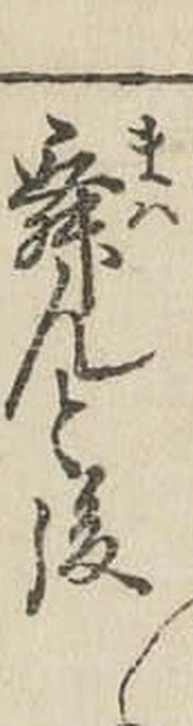舞んと後
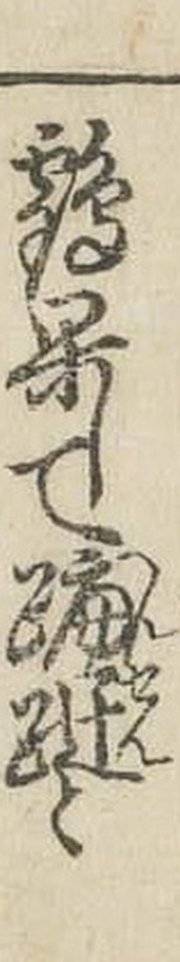鶴果して蹁躚と
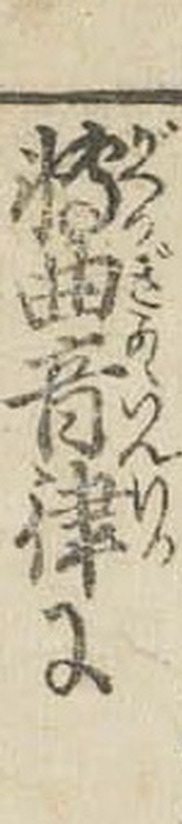転曲音律に
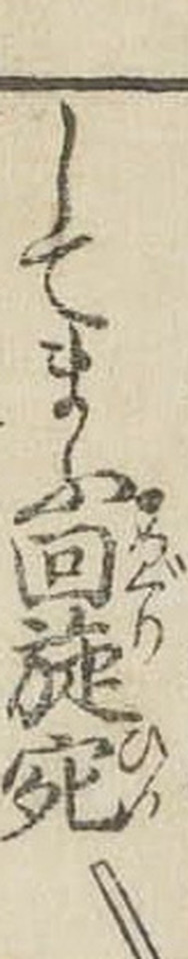してまふ。回旋宛
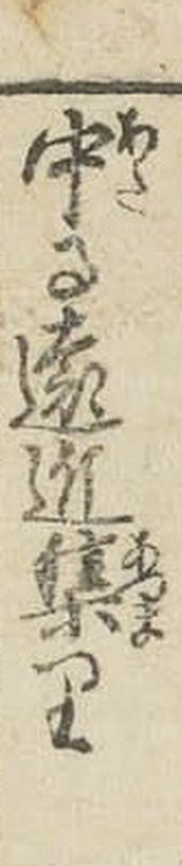中る遠近集り
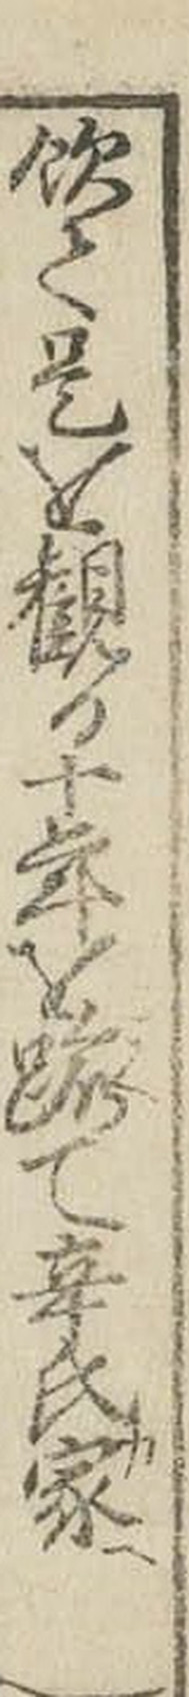飲て是を観る十年を踰て辛氏か家へ
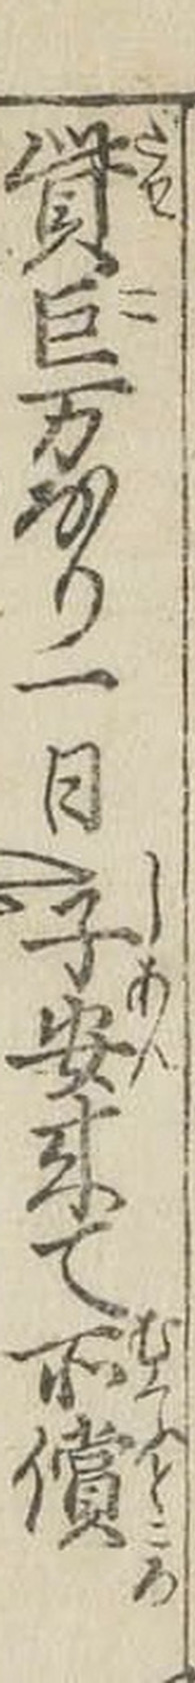貲巨万なり一日子安来て所償
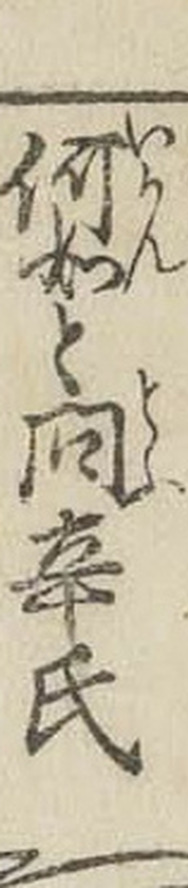何如と問辛氏
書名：絵本写宝袋 9巻 7之巻
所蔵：東京学芸大学教育コンテンツアーカイブ
